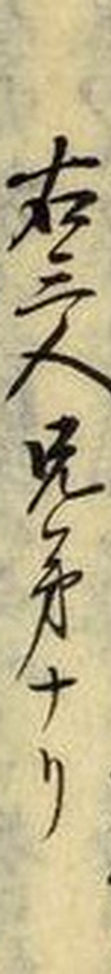右三人兄弟ナリ
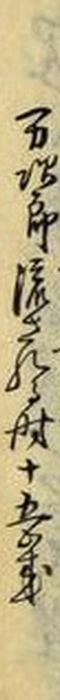万次郎流される時十五歳

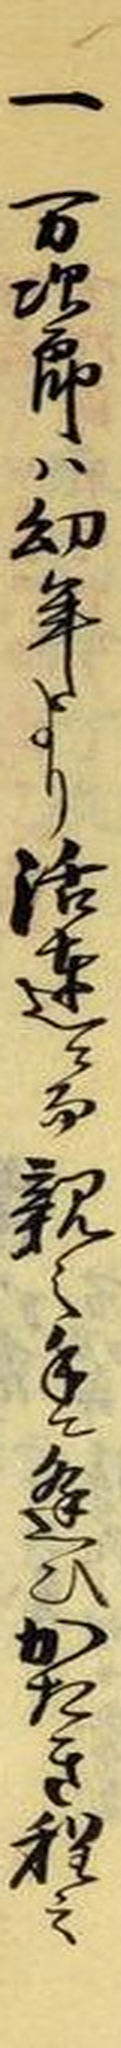一万次郎ハ幼年より活達ニ而親之手ニ逢ひかたき程之
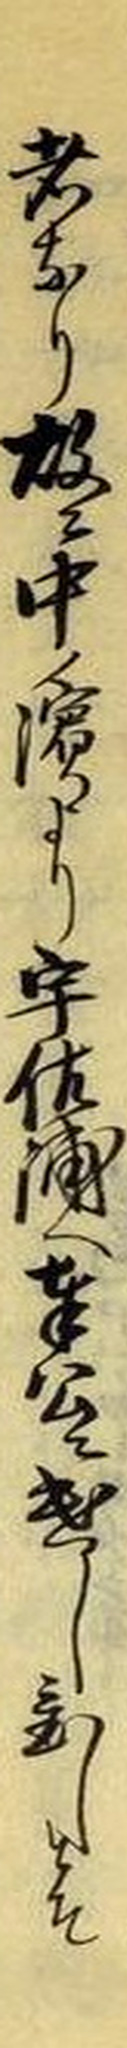者なり故ニ中濱より宇佐浦へ奉公ニ遣し置しとそ
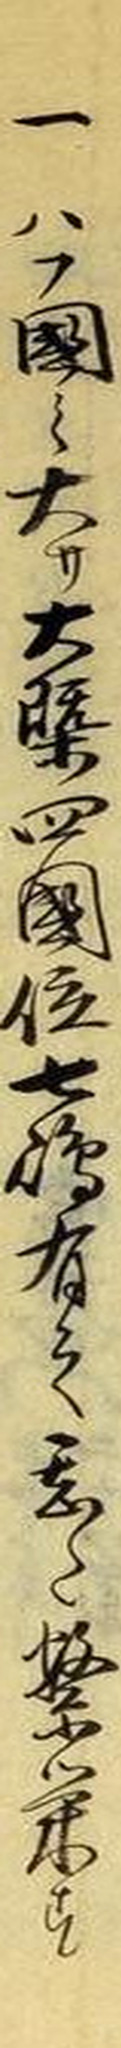一ハフ国之大サ大概四国位七嶋有て甚々繁栄す
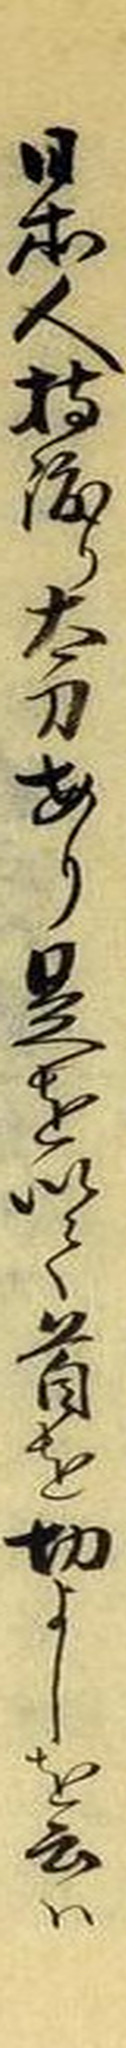日本人持渡り太刀あり是を以て首を切よしを云い
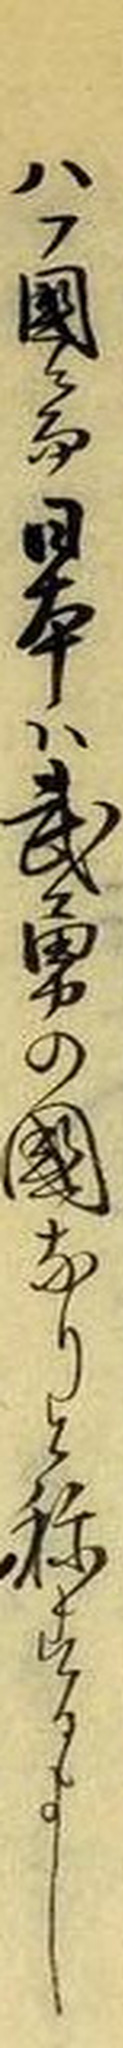ハフ国ニ而日本ハ武勇の国なりと称するよし
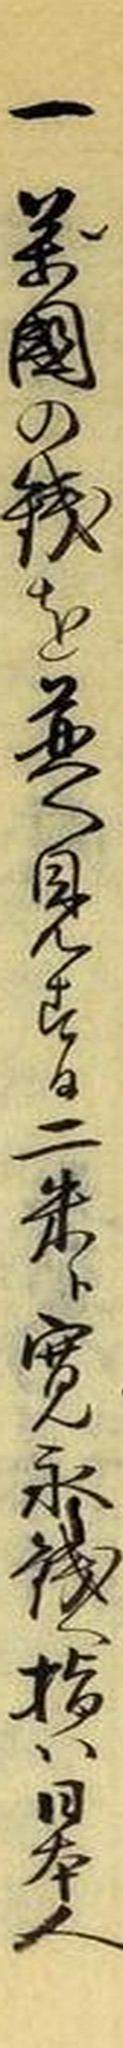一万国の銭を並へ見するニ朱ト寛永銭へ指ハ日本人
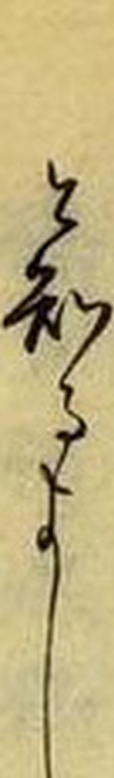と知るよし
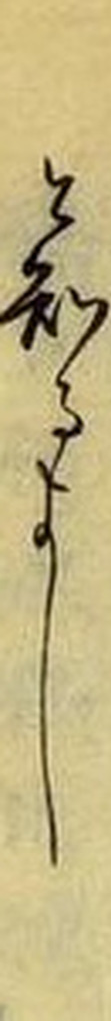と知るよし
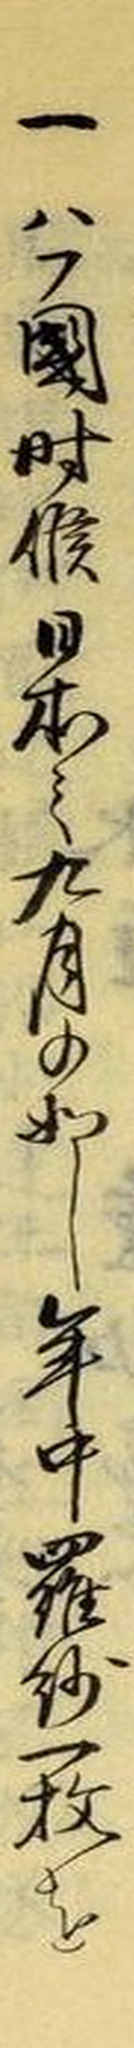一ハフ国時候日本之九月の如し年中羅紗一枚を
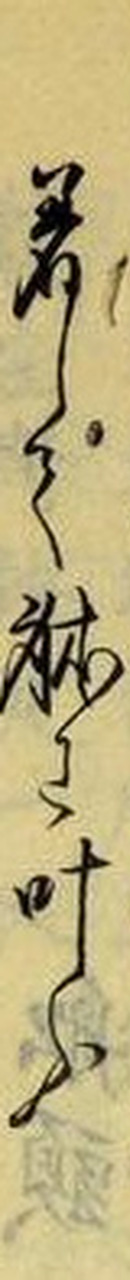着して体に叶ふ
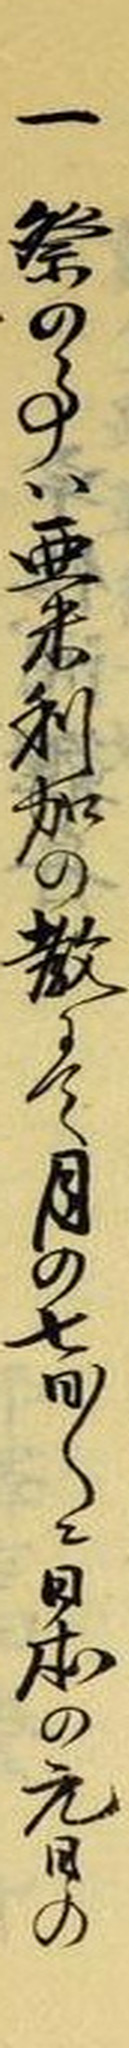一祭の事ハ亜米利幹の教にて月の七日〳〵ニ日本の元日の
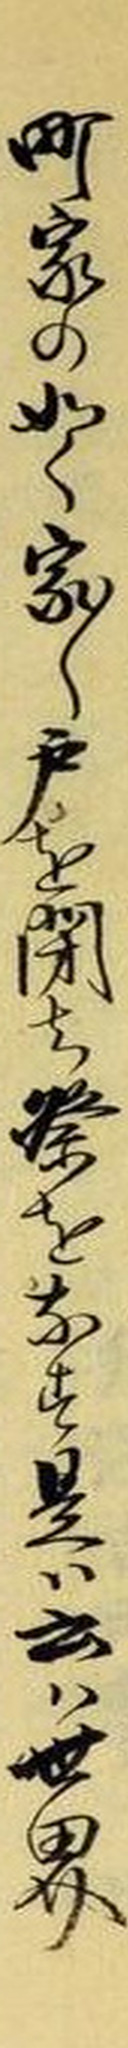町屋の如く家〳〵戸を閉其祭をなす是ハ云ハ世界
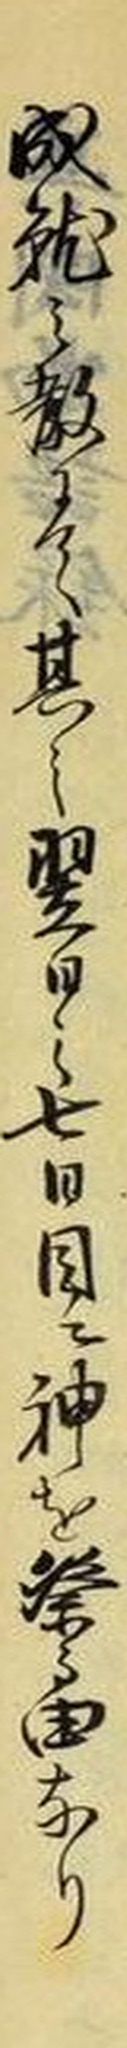成就の教にて其之翌日之七日目ニ神を祭る由なり
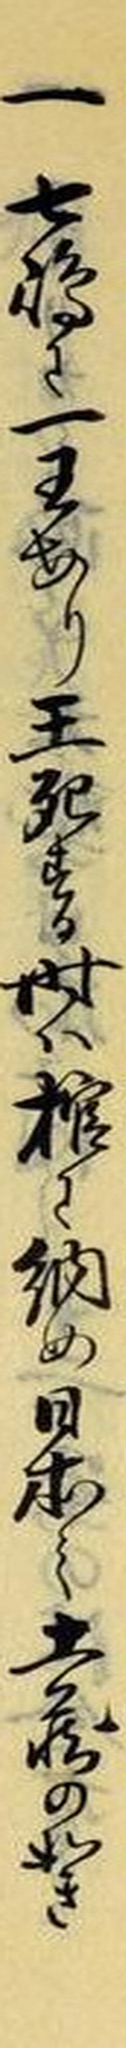一七嶋に一王あり王死する時ハ棺に納め日本之土蔵の如き
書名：漂客談奇（備考雑録写8）
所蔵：福井県文書館 Fukui Prefectural Archives
